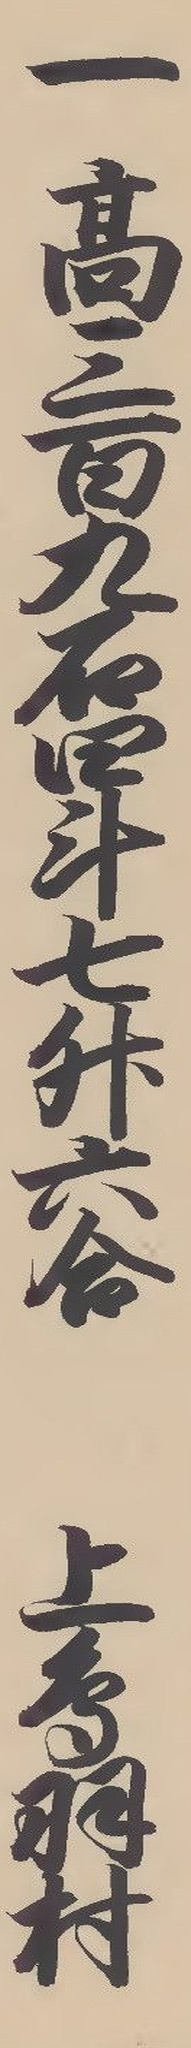一高三百九石四斗七升六合上鳥羽村
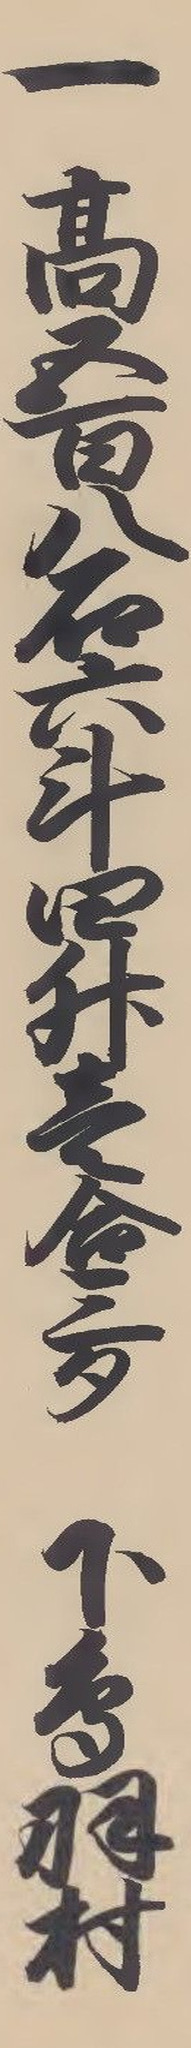一高五百八石六斗四升壱合三勺下鳥羽村
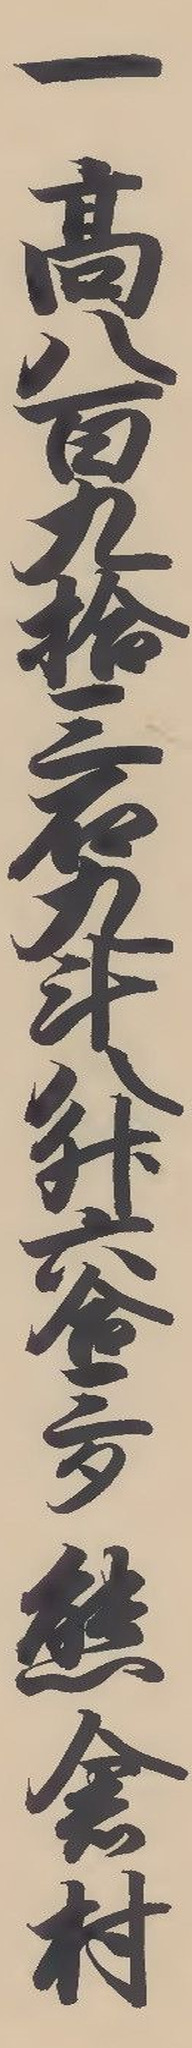一高八百九拾三石九斗八升六合三勺熊倉村
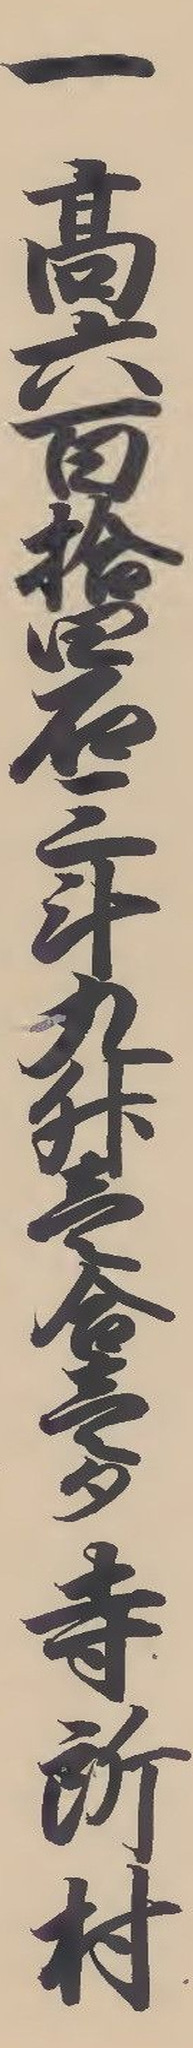一高六百拾四石三斗九升壱合壱勺寺所村

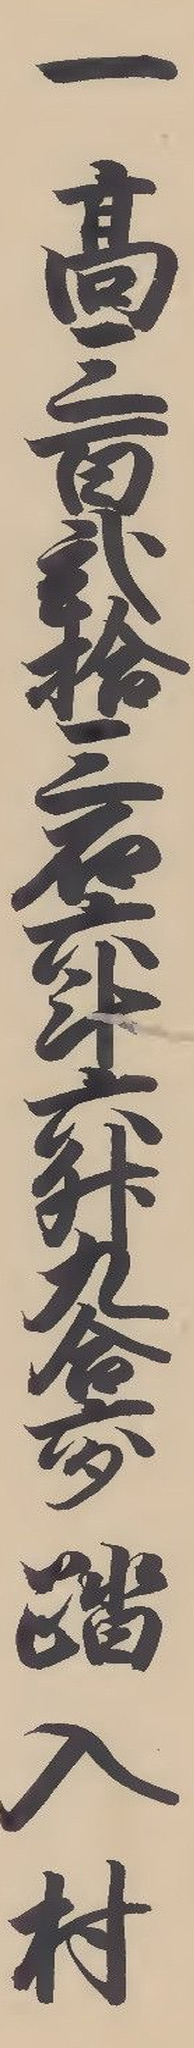一高三百弐拾三石六斗六升九合六勺踏入村
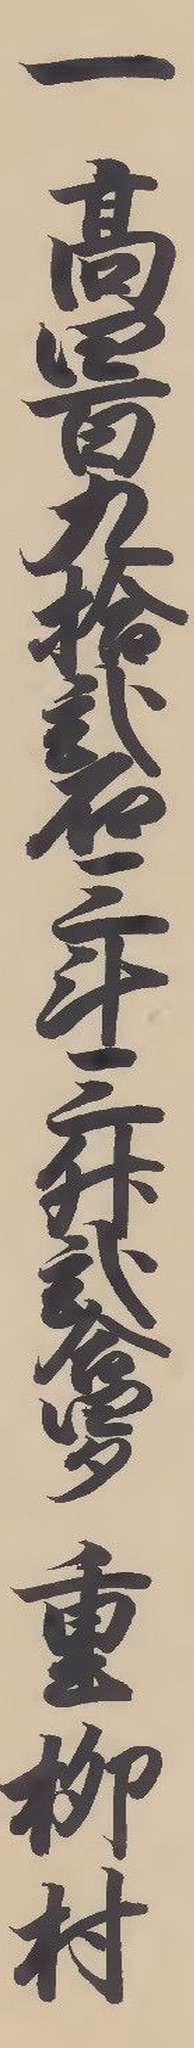一高四百九拾弐石三斗三升弐合四勺重柳村
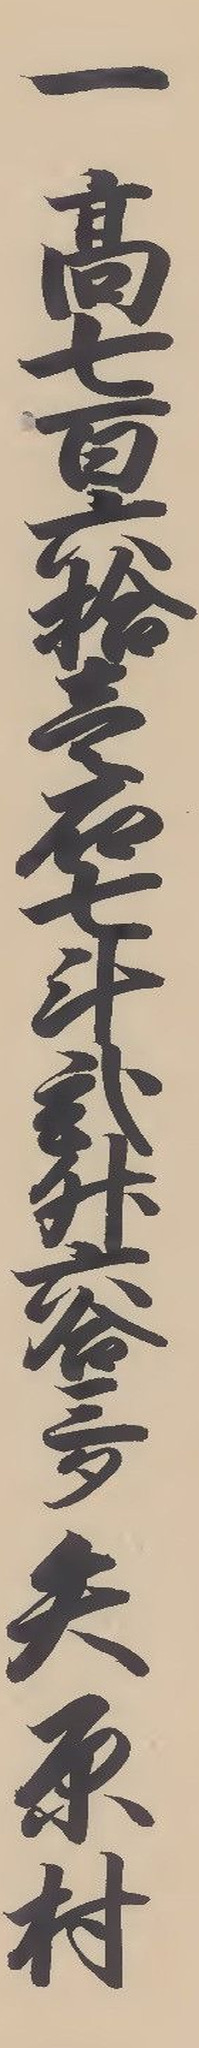一高七百六拾壱石七斗弐升六合三勺矢原村
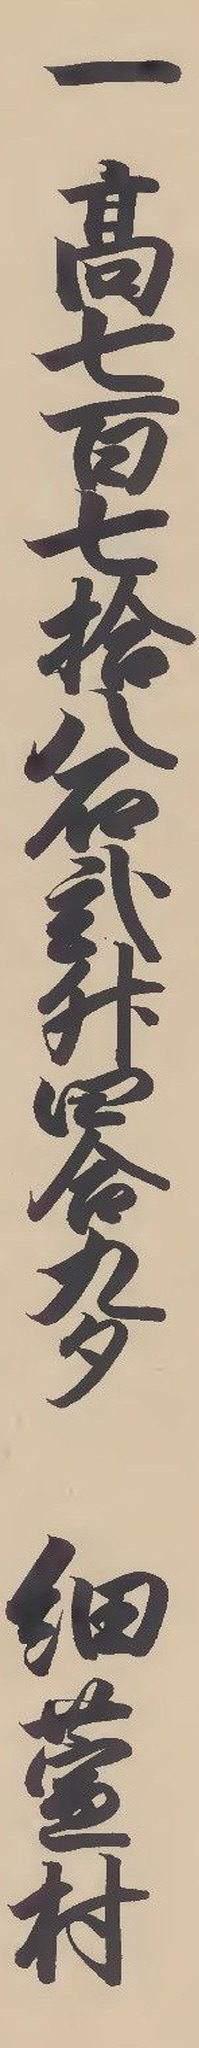一高七百七拾八石弐升四合九勺細萱村
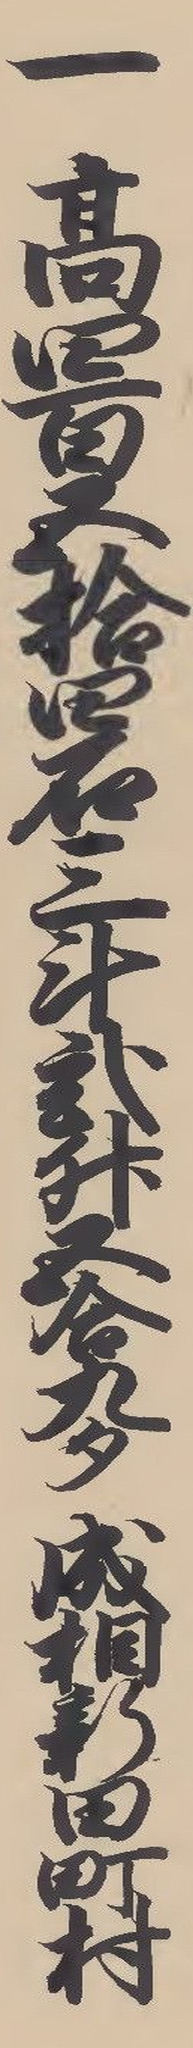一高四百五拾四石三斗弐升五合九勺成相新田町村
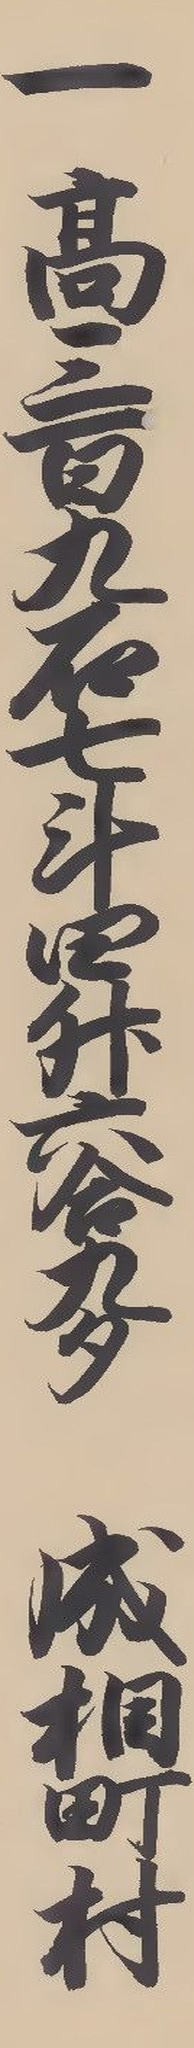一高三百九石七斗四升六合九勺成相町村
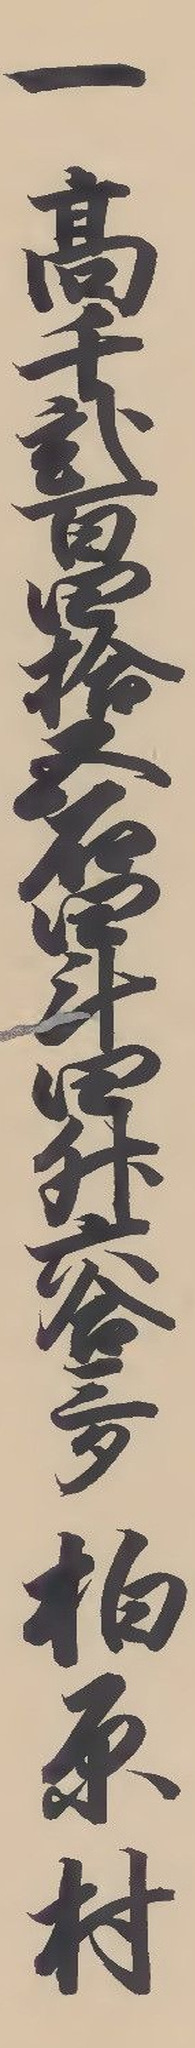一高千弐百四拾五石四斗四升六合三勺柏原村

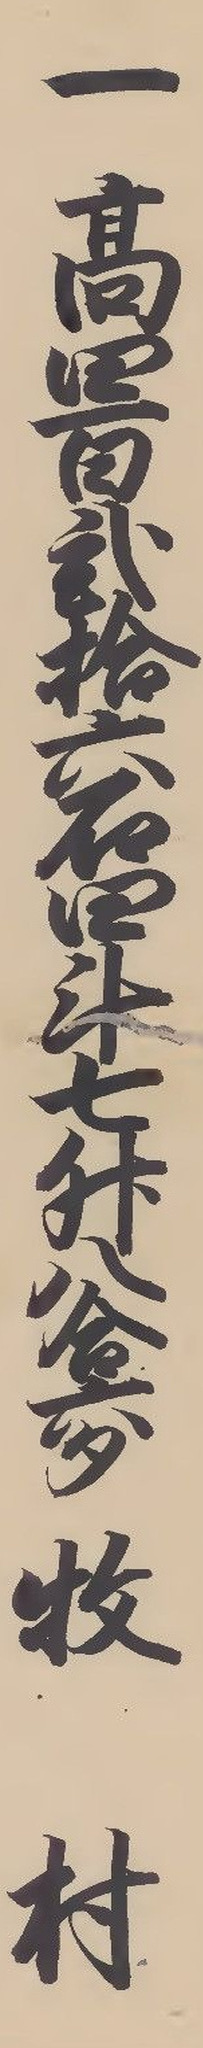一高四百弐拾六石四斗七升八合六勺枚村
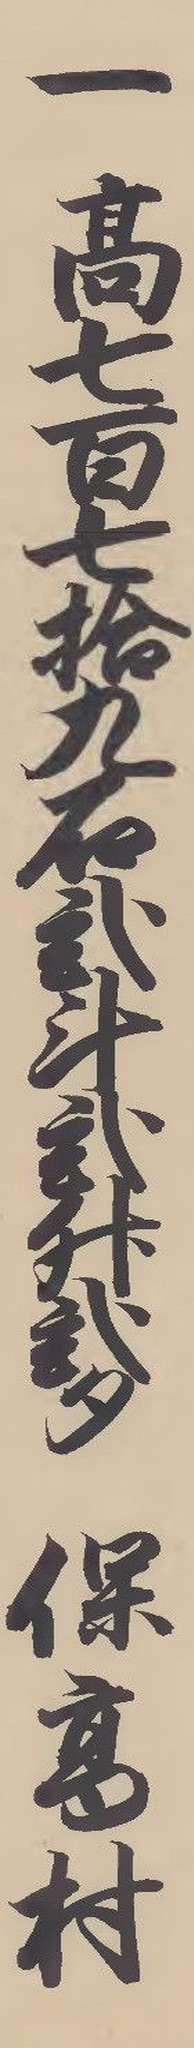一高七百七拾九石弐斗弐升弐勺保高村
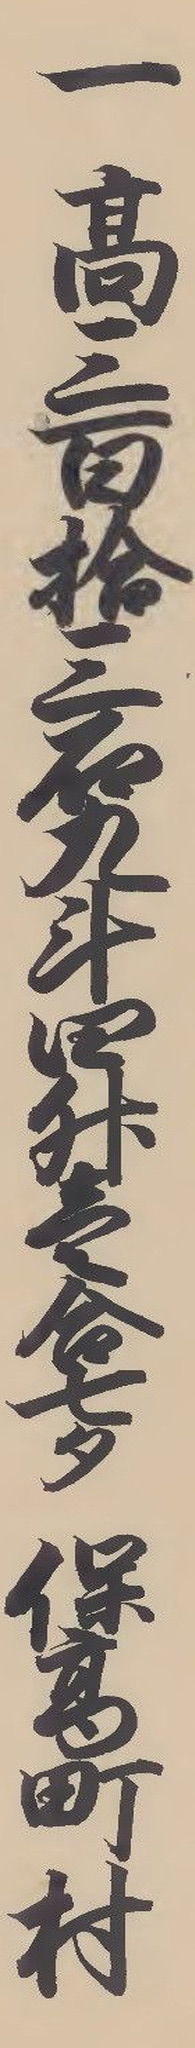一高三百拾三石九斗四升壱合七勺保高町村
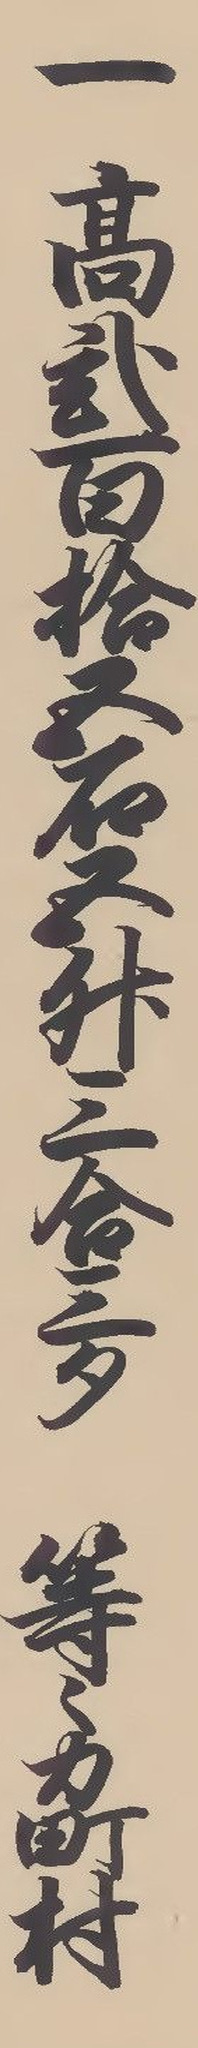一高弐百拾五石五升三合三勺等々力町村
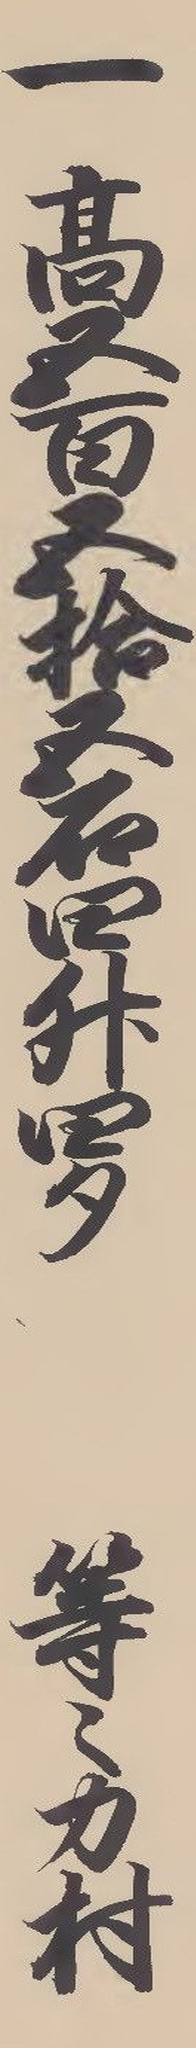一高五百五拾五石四升四勺等々力村
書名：信濃国郷帳
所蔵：国立公文書館 National Archives of Japan
